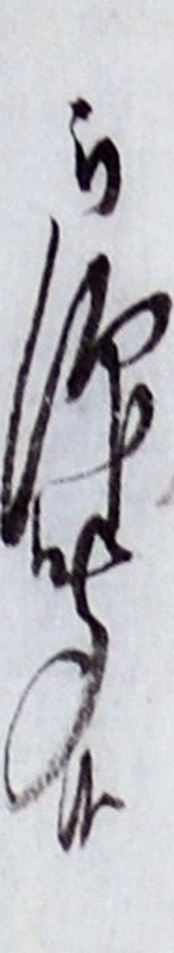被仰聞候
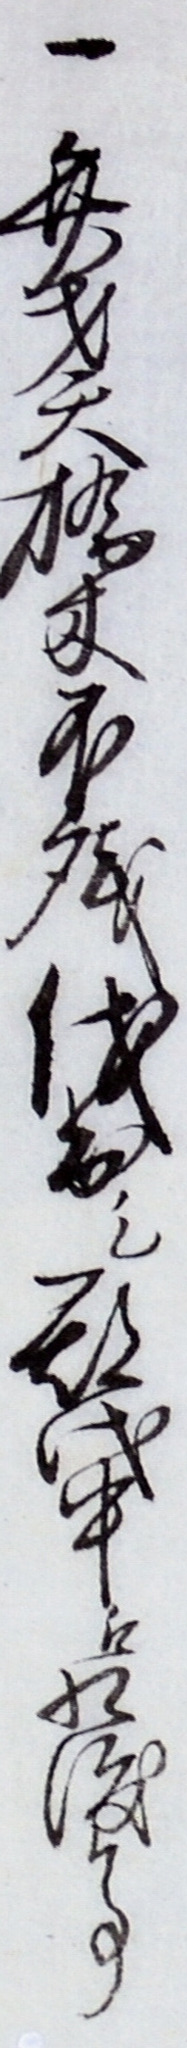一弁才天橋木不残伐出し郡代中江相渡候事
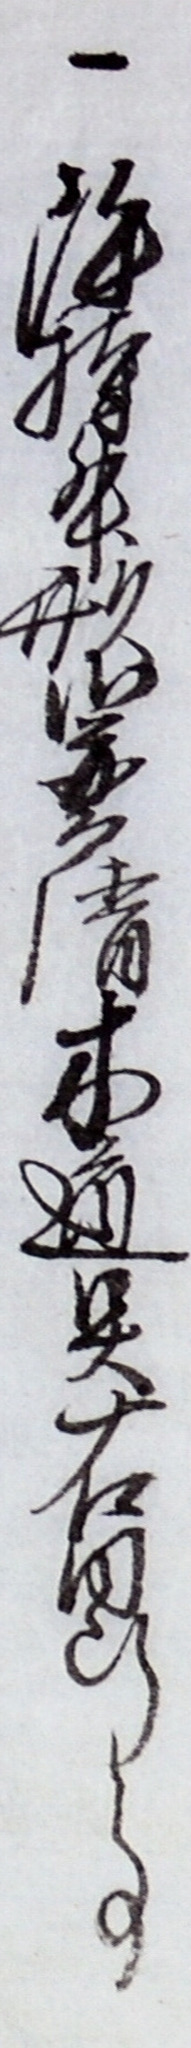一鉾持升形御普請木道具右同断之事
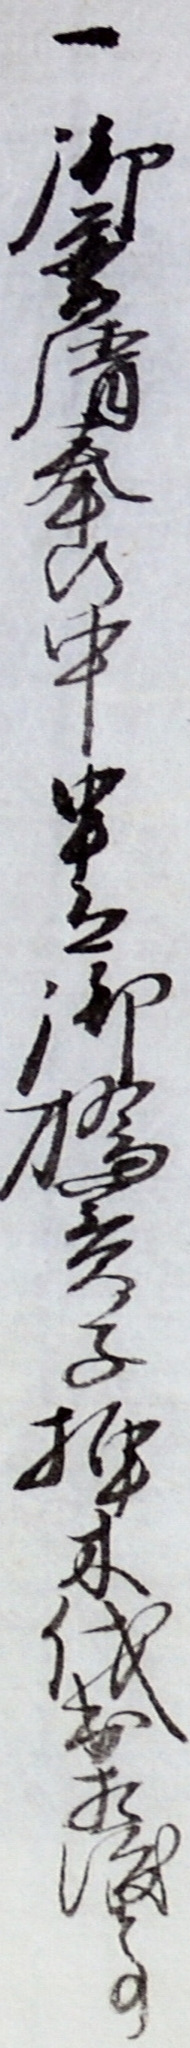一御普請奉行中申立御橋簀ノ子押木伐出相渡候事
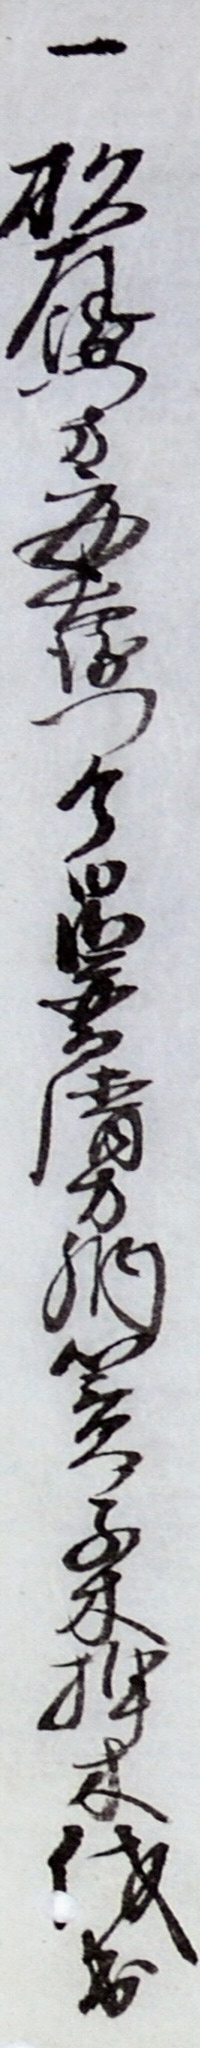一杉左衛門方藤右衛門今日御普請方納簀ノ子押木伐出
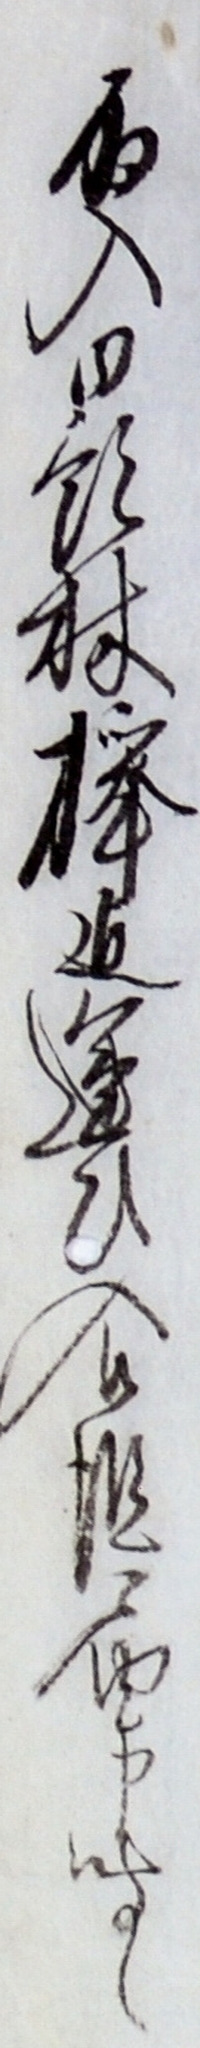取入日影林欅迄運ひ入候段届申聞候

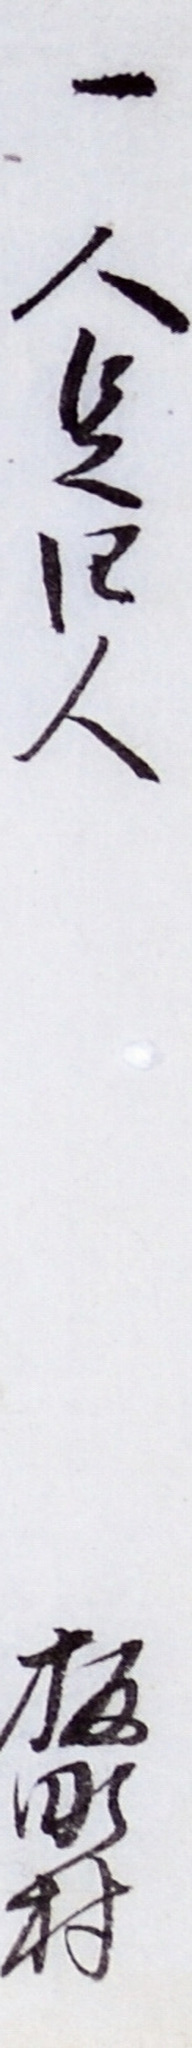一人足四人板町村
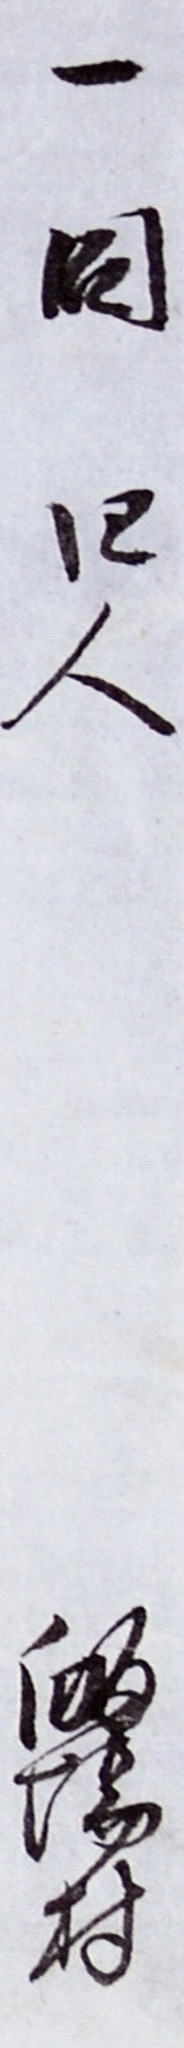一同四人的場村
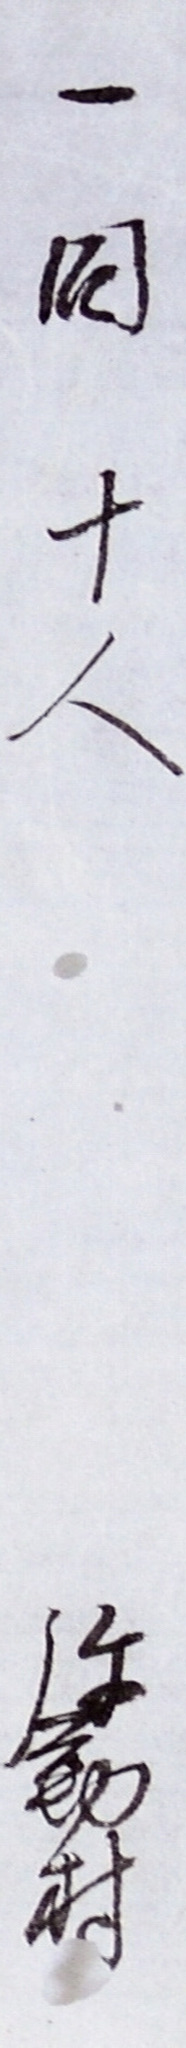一同十人弥勒村
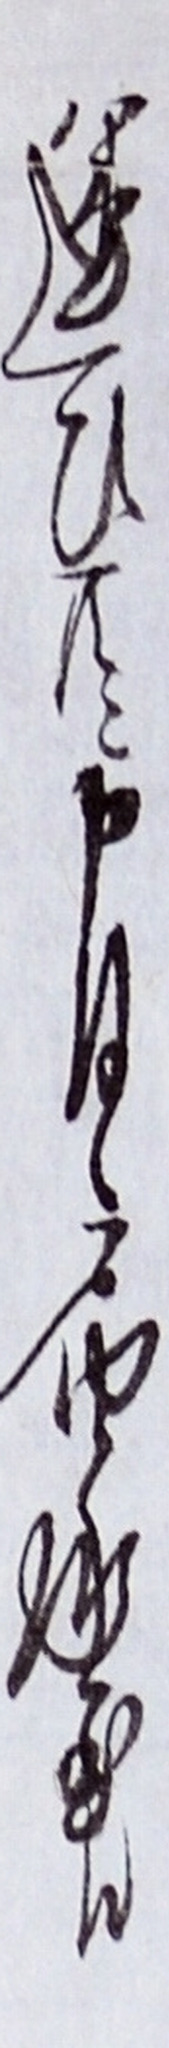運ひ共に申付候届承置候
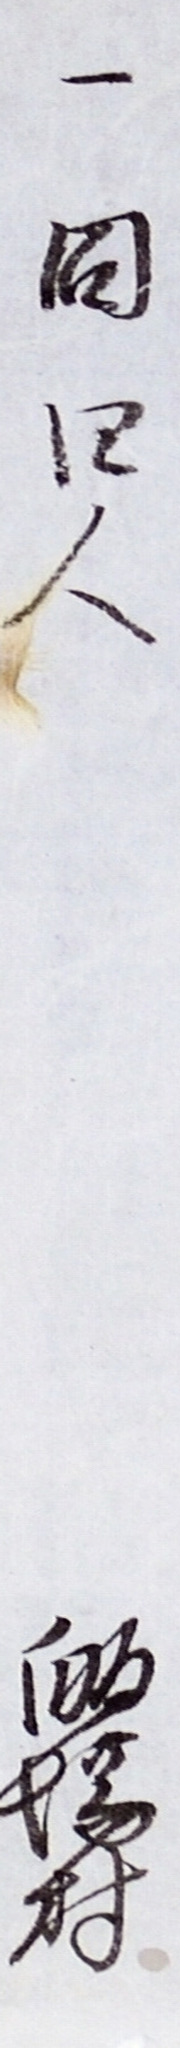一同四人的場村
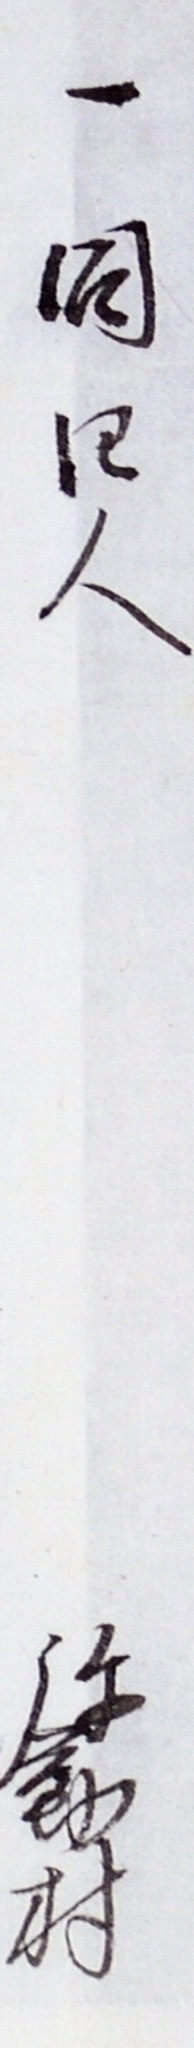一同四人弥勒村
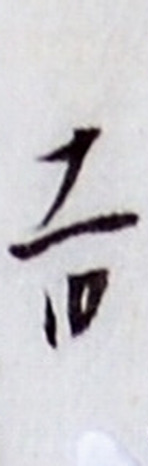十一日
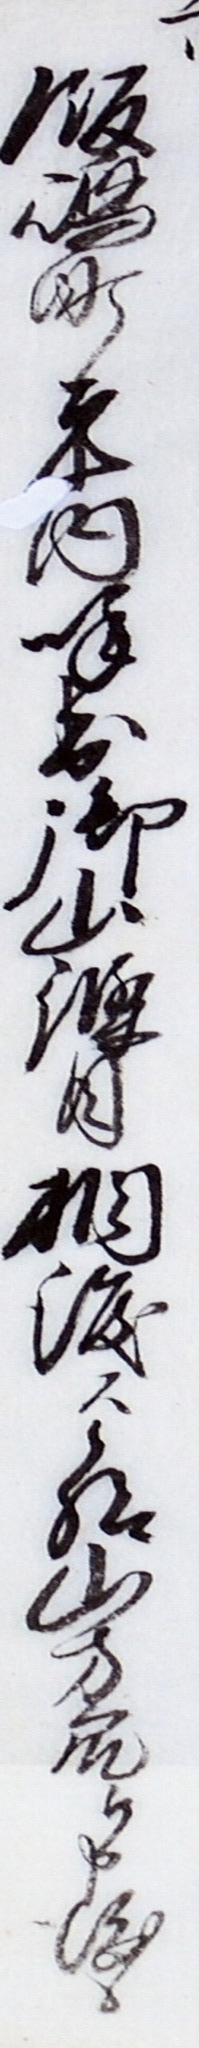飯嶋町東内呼出御山條目相渡ス候様山方衆江申渡候
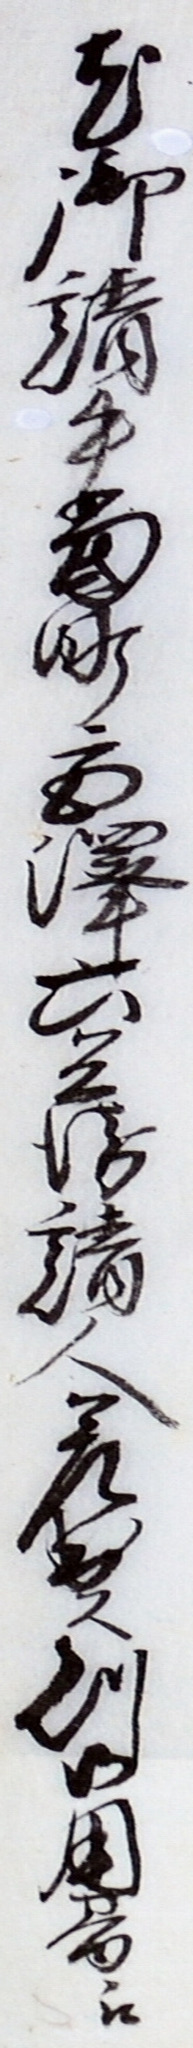尤御請書当町宮沢六兵衛請人差出ス則御用番江
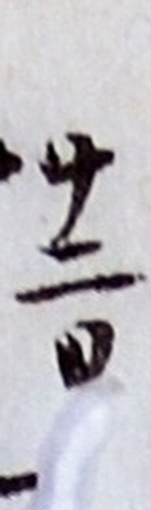十二日
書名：御山奉行御用控
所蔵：伊那市立高遠町図書館・合同会社AMANE
